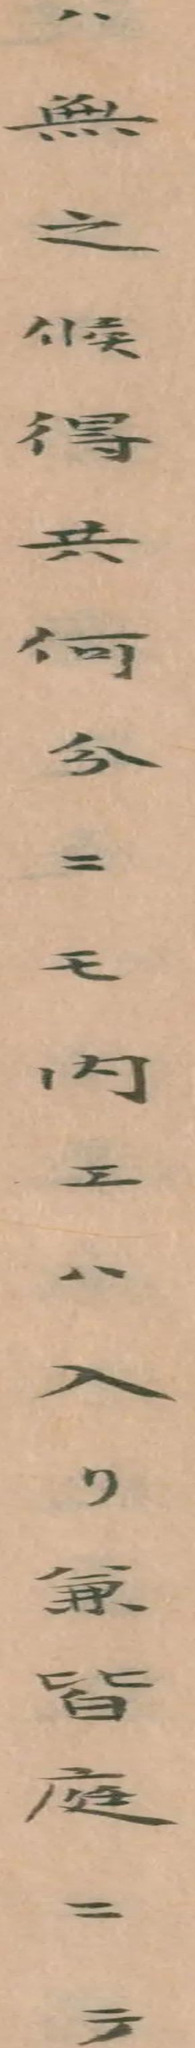ハ無之候得共何分ニモう内二ハ入り兼皆庭二
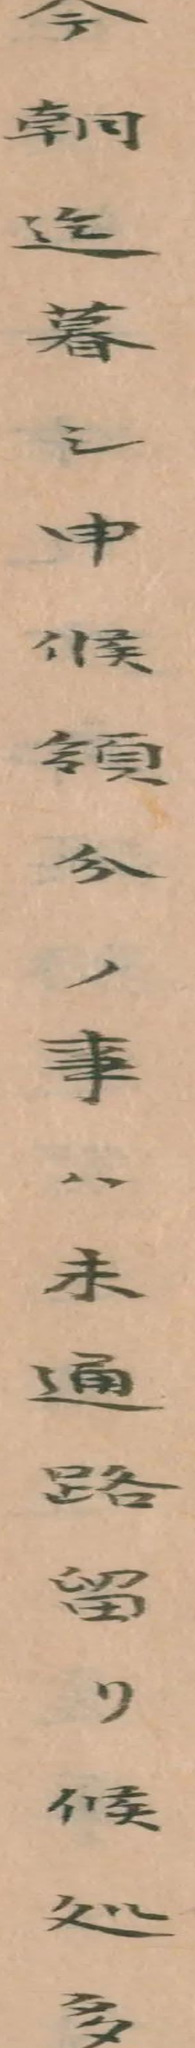今朝迄暮シ申候領分之事ハ未通路留り候処多
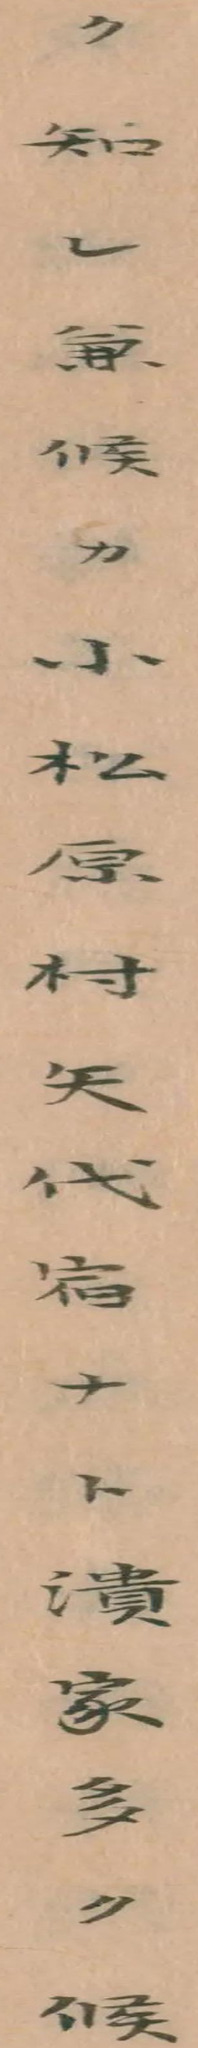ク知レ兼候カ小松原村矢代宿ナト潰家多ク候
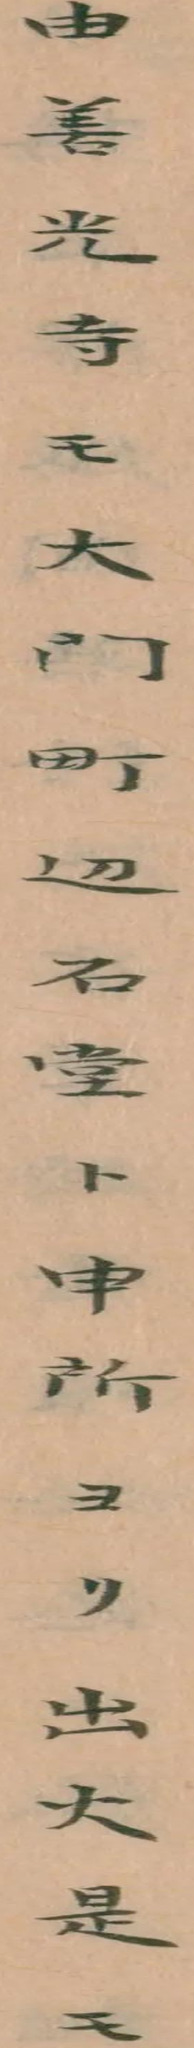由善光寺モ大門町辺石堂ト申所ヨリ出火是モ
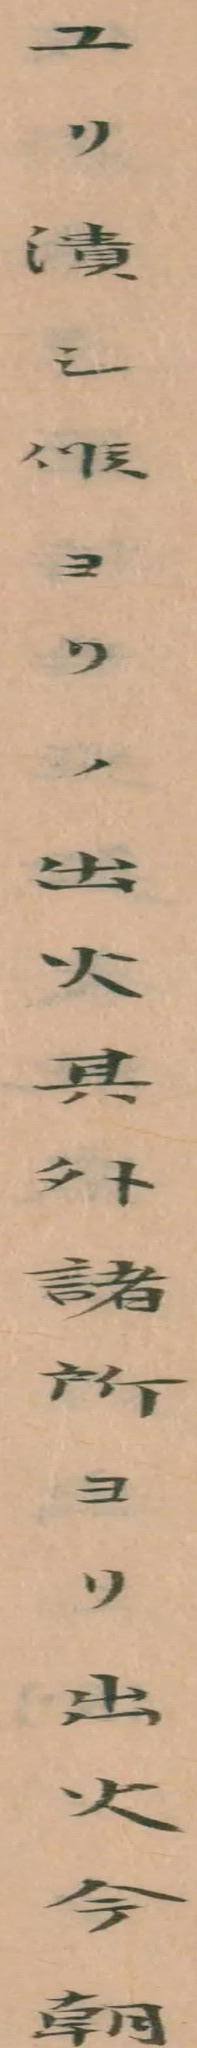ユリ潰シ候ヨリノ出火其外諸所ヨリ出火今朝
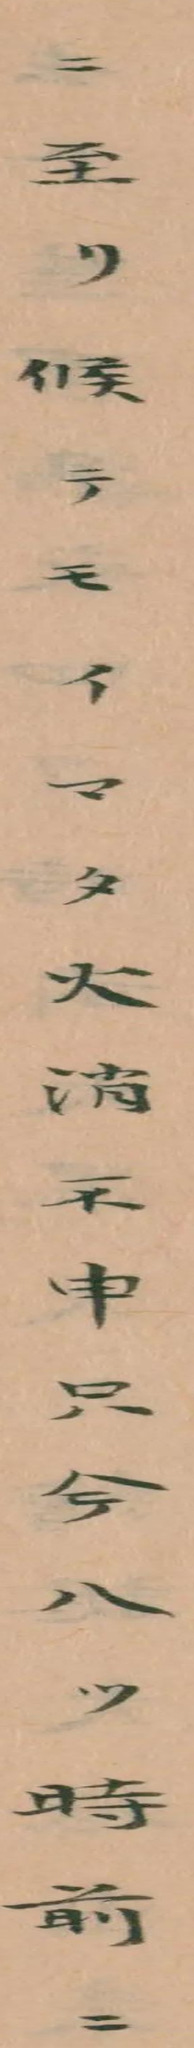二至り候テモイマタ火消不申只今八ッ時前二
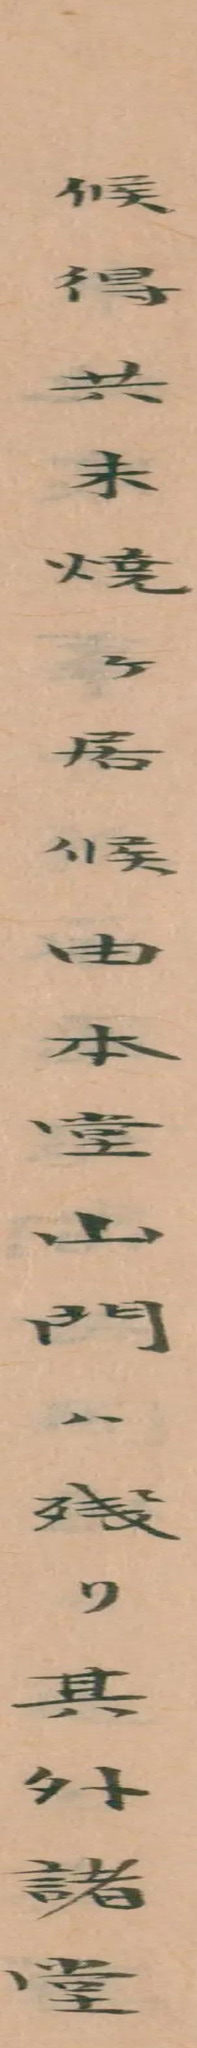候得共未焼ヶ居候由本堂山門ハ残り其外諸堂
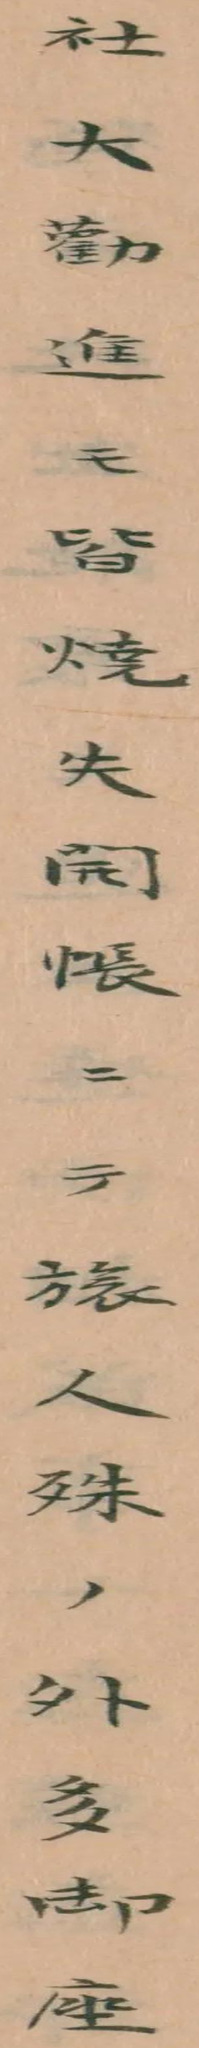社大勧進モ皆焼失開帳ニテ旅人殊ノ外多御座
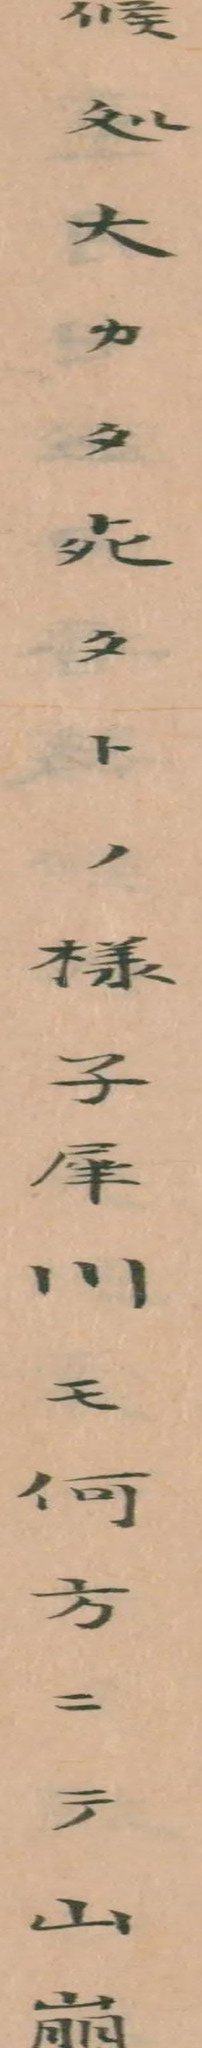候処大カタ死タトノ様子犀川モ何方ニテ山崩
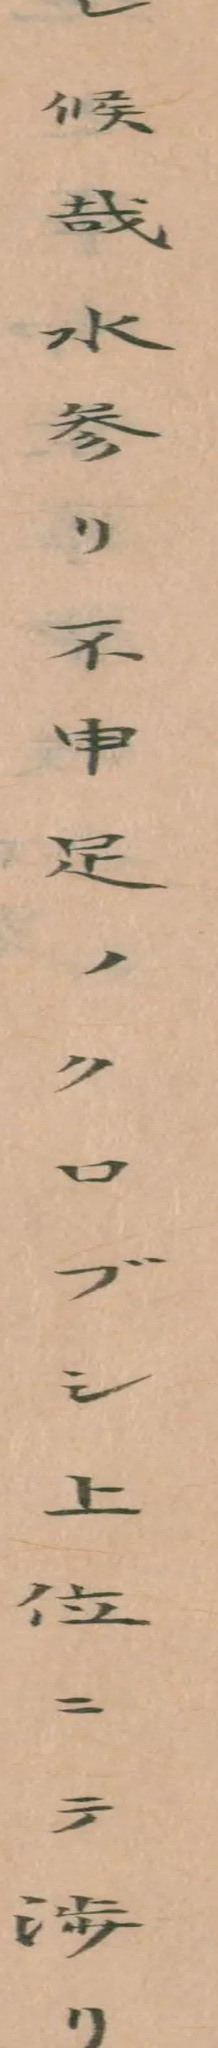シ候哉水参り不申足ノクロブシ上位ニテ渉り
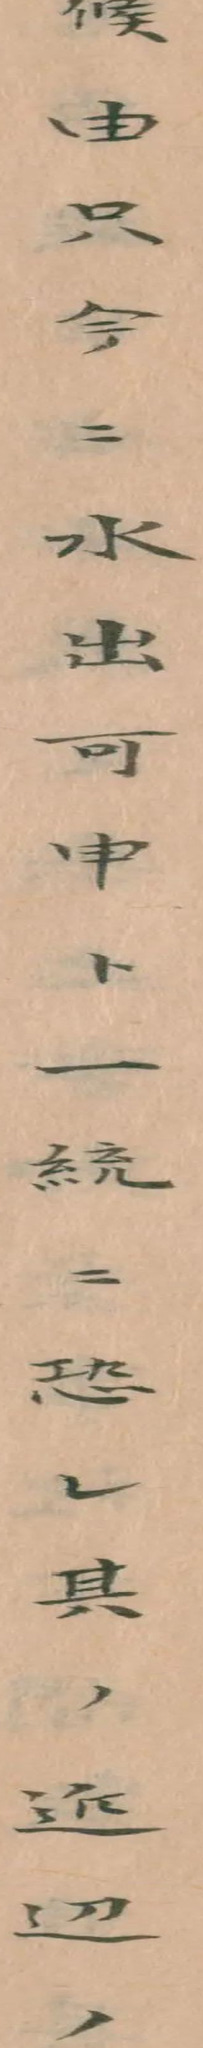候由只今二水出可申ト一統二恐レ其ノ近辺ノ
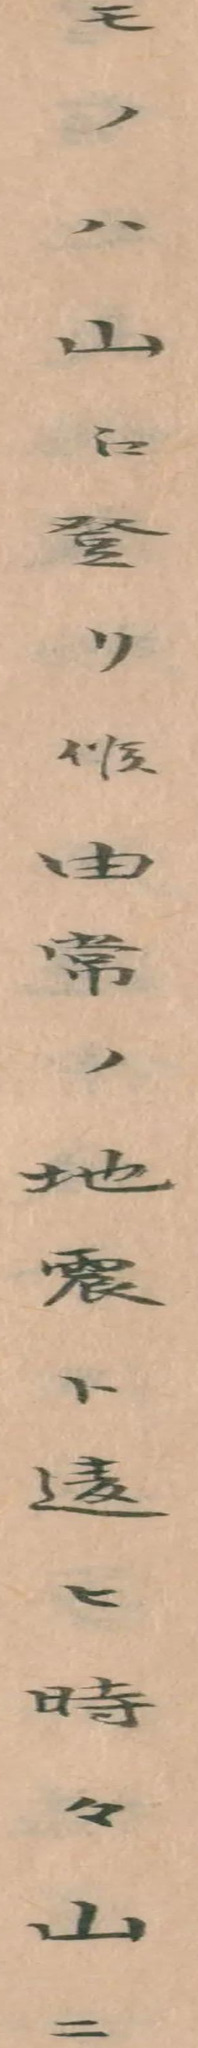モノハ山江登り候由常ノ地震ト違ヒ時々山二
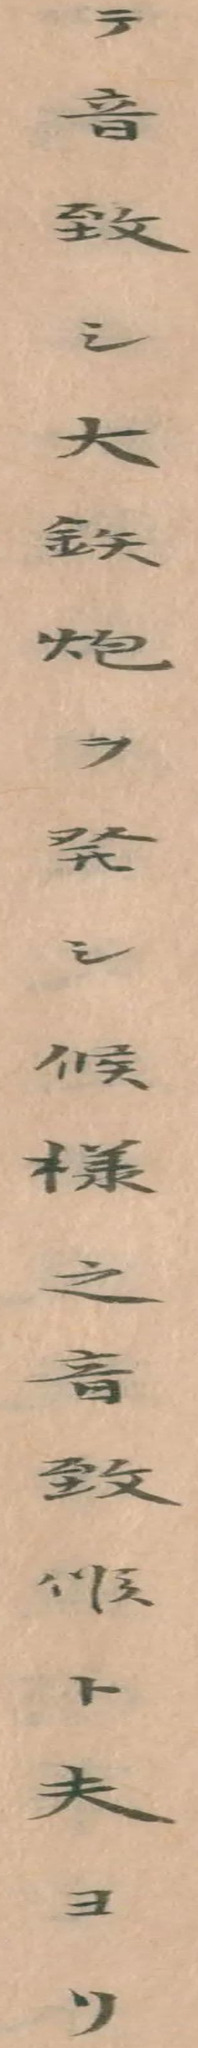テ音致し大鉄炮ヲ発シ候様之音致候ト夫ヨリ
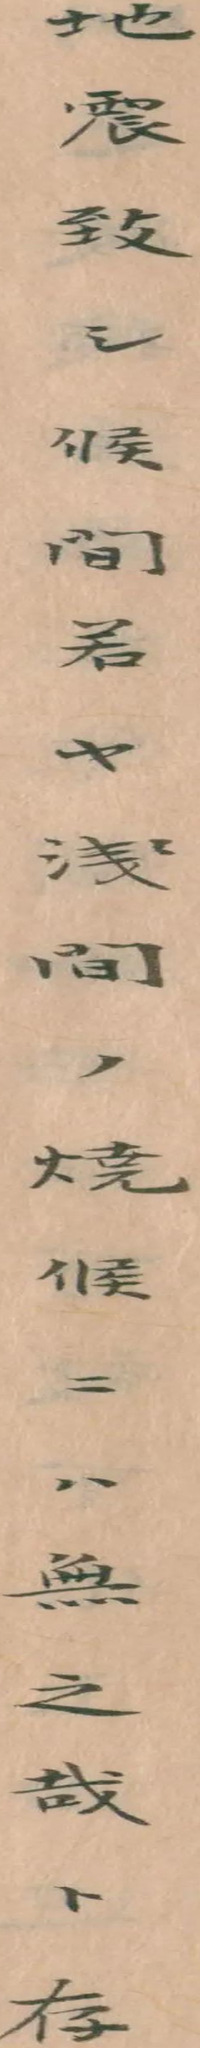地震致シ候間若ヤ浅間ノ焼候二ハ無之哉ト存
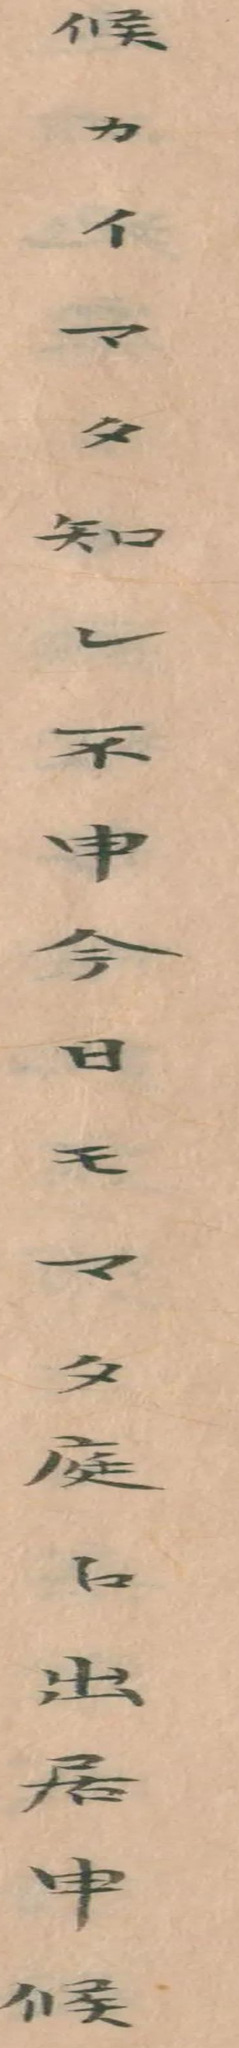候カイマタ知レ不申今日モマタ庭江出居申候
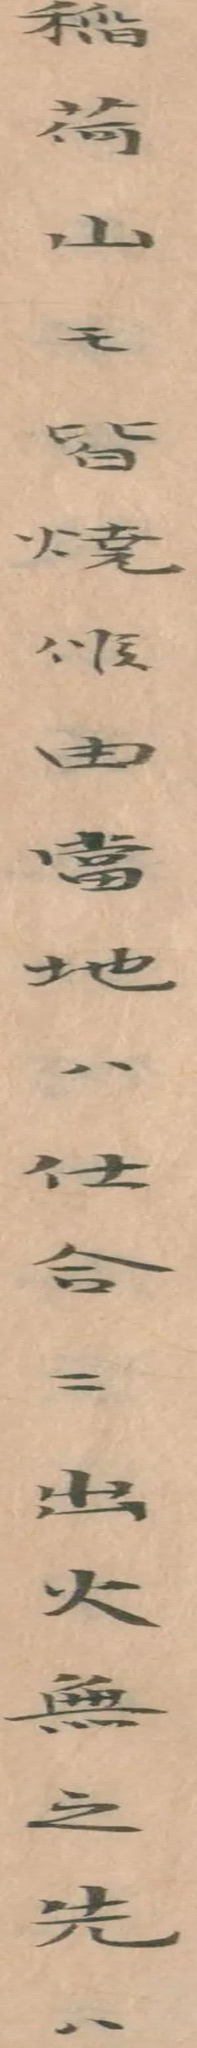稲荷山モ皆焼候由当地ハ仕合二出火無之先ハ
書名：地災撮要. 巻1(噴火山・地震ノ部)
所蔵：国立国会図書館 National Diet Library, JAPAN
